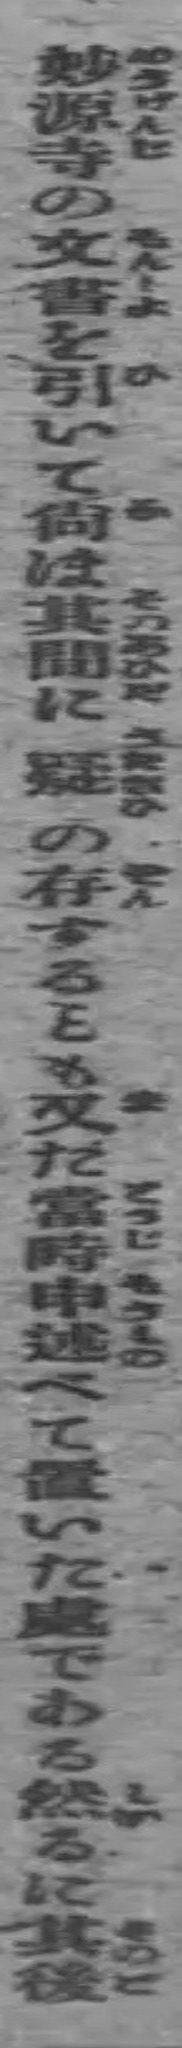妙源寺の文書を引いて尚ほ其間に疑の存することも又た当時申述べて置いた処である然るに其後
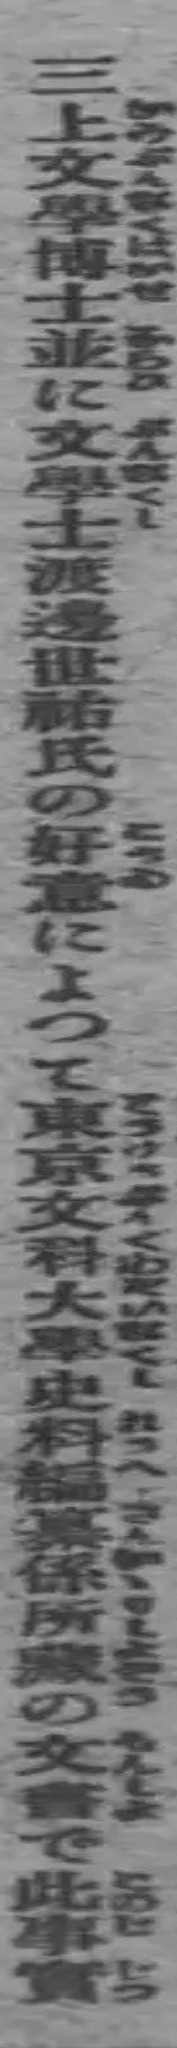三上文学博士並に文学士渡邊世祐氏の好意によつて東京文科大学史料編纂係所蔵の文書で此事実
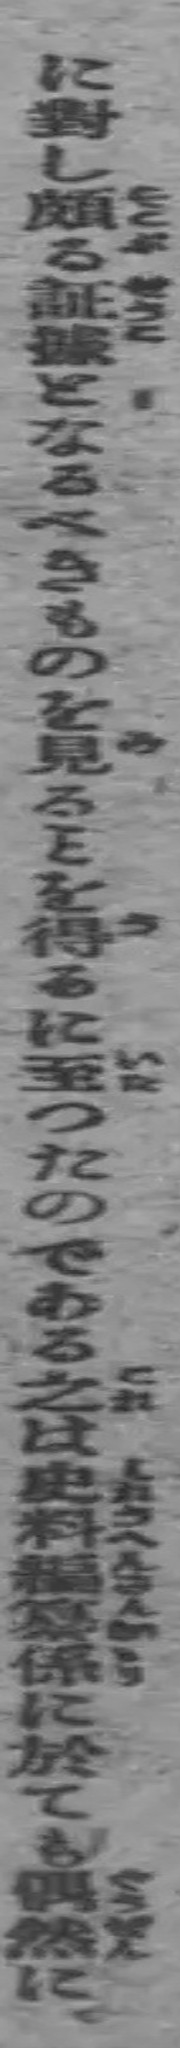に対し頗る証拠となるべきものを見ることを得るに至つたのである之は史料編纂係に於ても偶然に
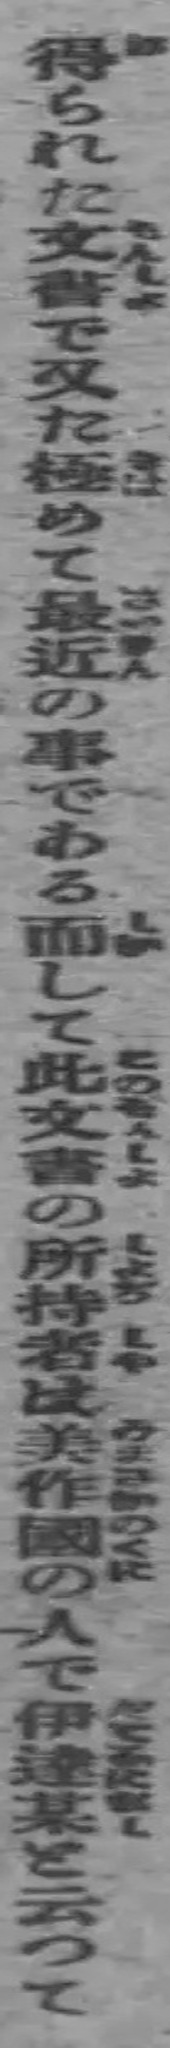得られた文書で又た極めて最近の事である而して此文書の所持者は美作国の人で伊達某と云つて
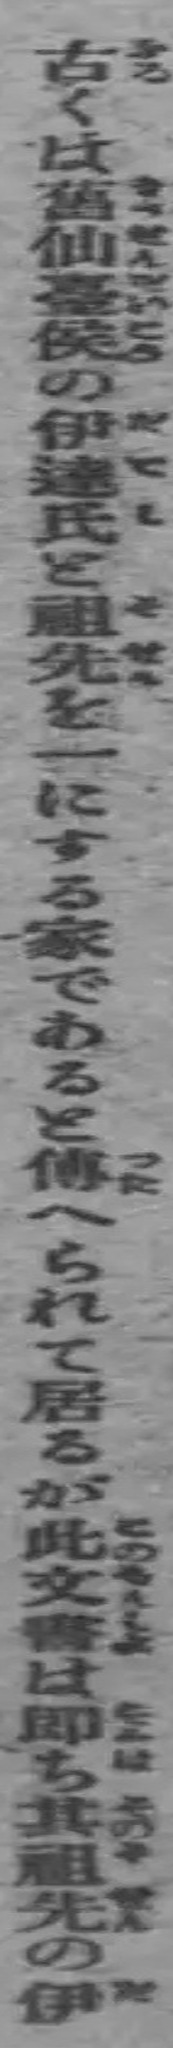古くは旧仙台侯の伊達氏と祖先を一にする家であると伝へられて居るが此文書は即ち其祖先の伊
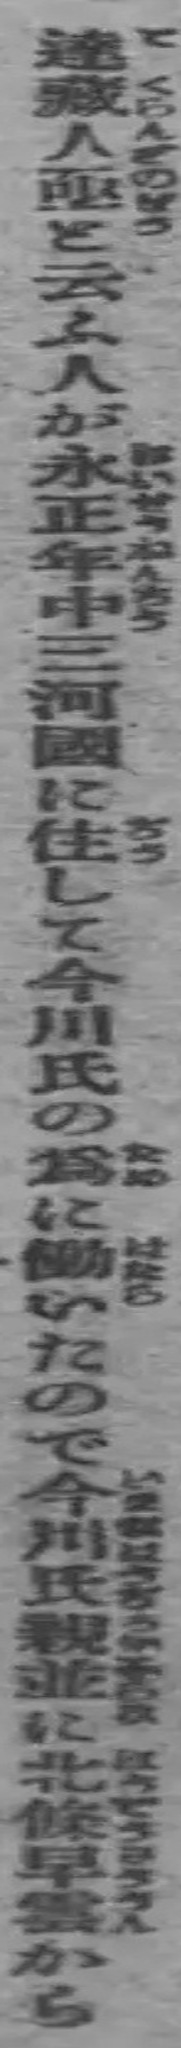達蔵人丞と云ふ人が永正年中三河国に住して今川氏の為に働いたので今川氏親並に北条早雲から
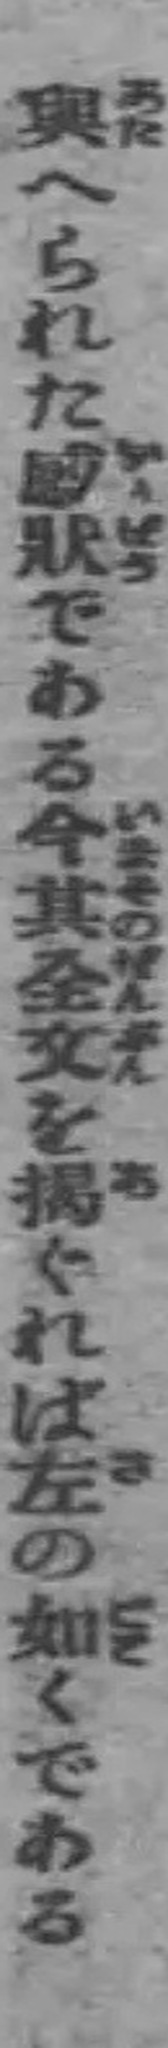与へられた感状である今其全文を掲ぐれば左の如くである
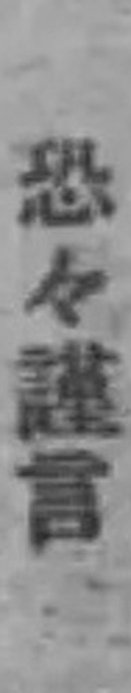恐々謹言
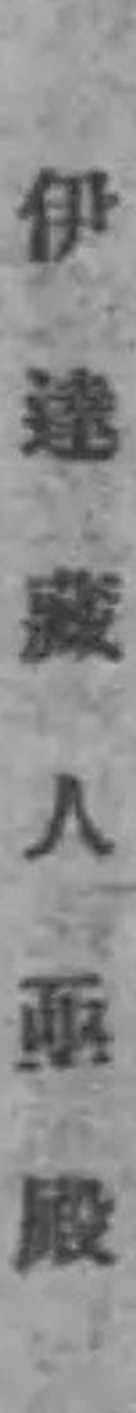伊達蔵人丞殿
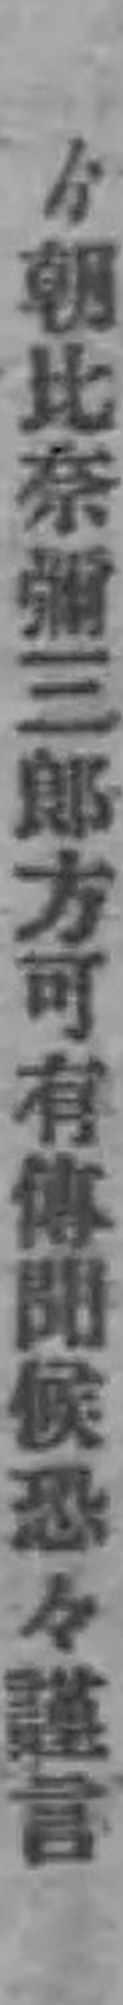ゟ朝比奈弥三郎方可有伝聞候恐々謹言
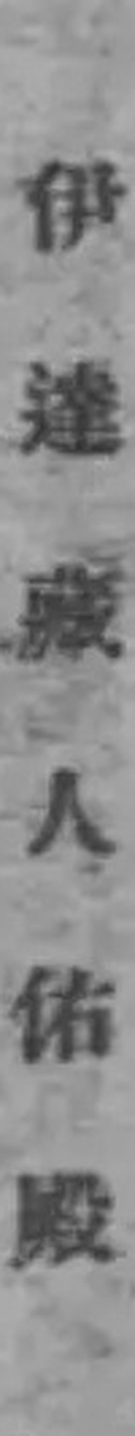伊達蔵人丞殿
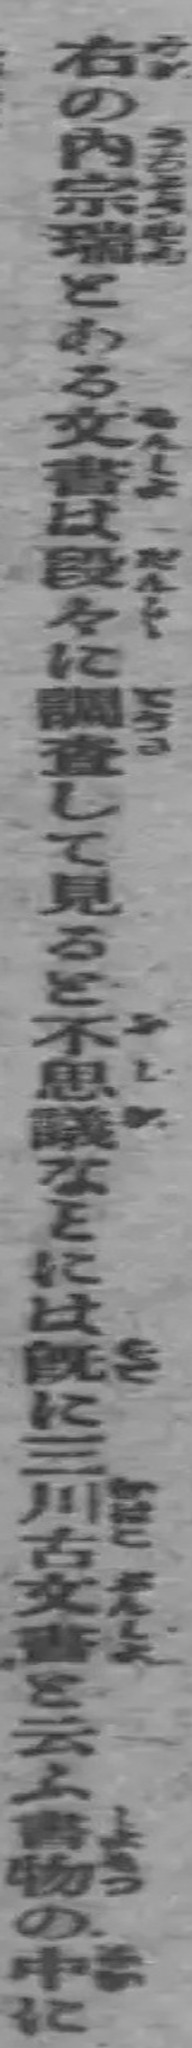右の内宗瑞とある文書は段々に調査して見ると不思議なことには既に三河古文書と云ふ書物の中に
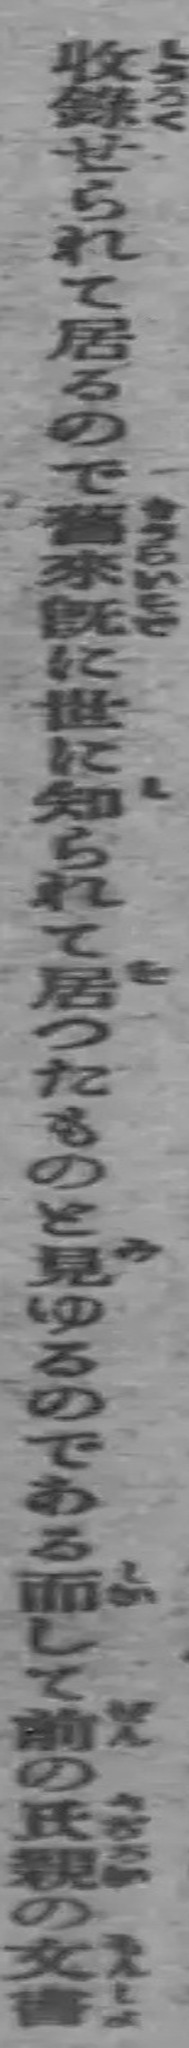収録せられて居るので旧来既に世に知られて居つたものと見ゆるのである而して前の氏親の文書

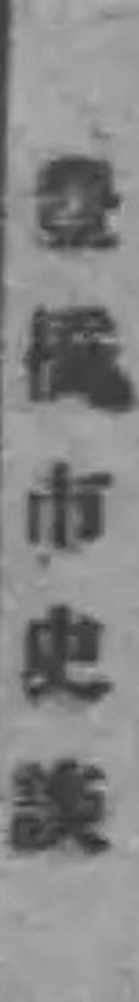豊橋市史談
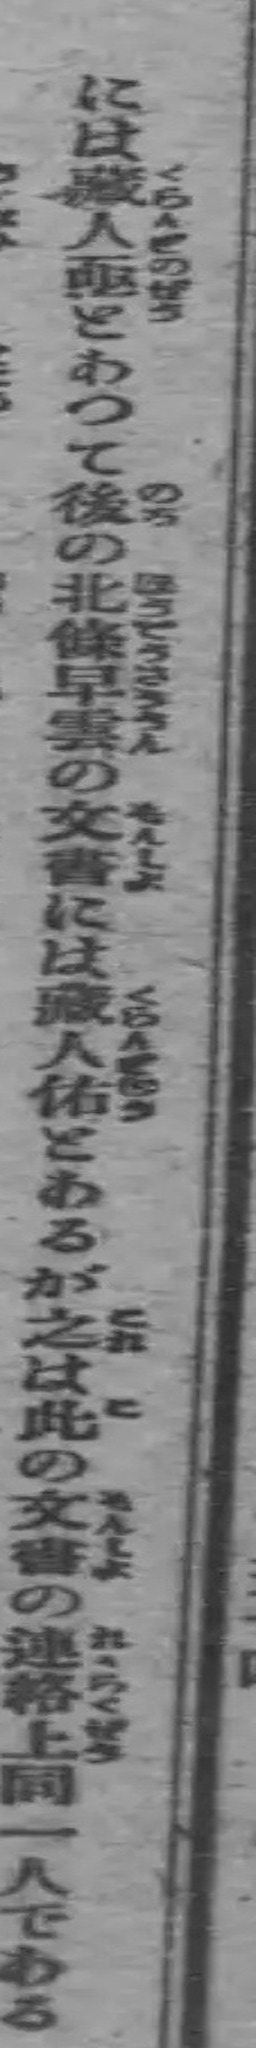には蔵人丞とあつて後の北条早雲の文書には蔵人佑とあるが之は此の文書の連絡上同一人である
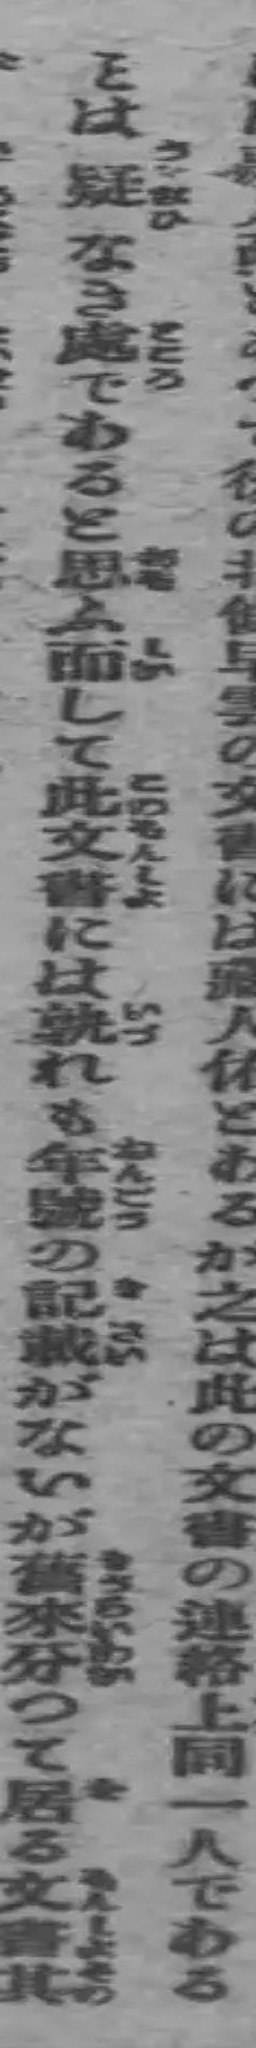ことは疑なき処であると思ふ而して此文書には孰れも年号がないが旧来分つて居る文書其
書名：豊橋市史談
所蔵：国立国会図書館 National Diet Library, JAPAN
